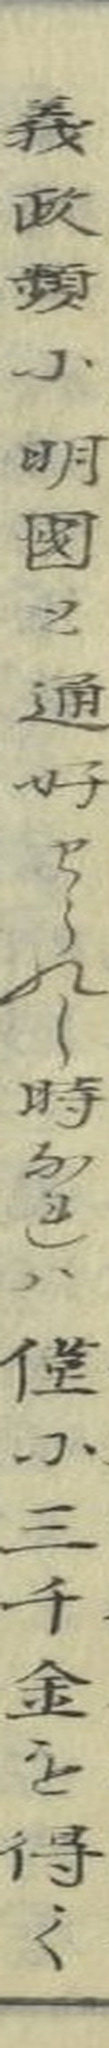義政頻に明国と通好せられし時なれは僅に三千金を得て
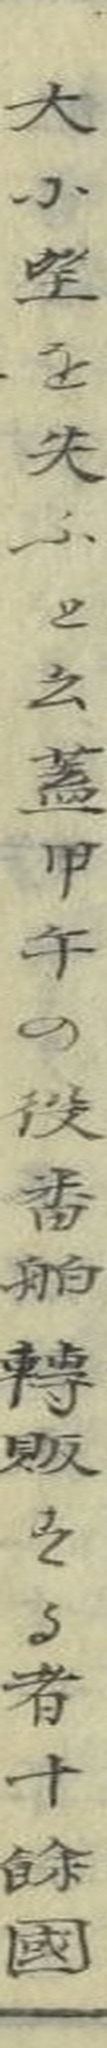大に望を失ふと云蓋甲午の役番舶転販する者十餘国
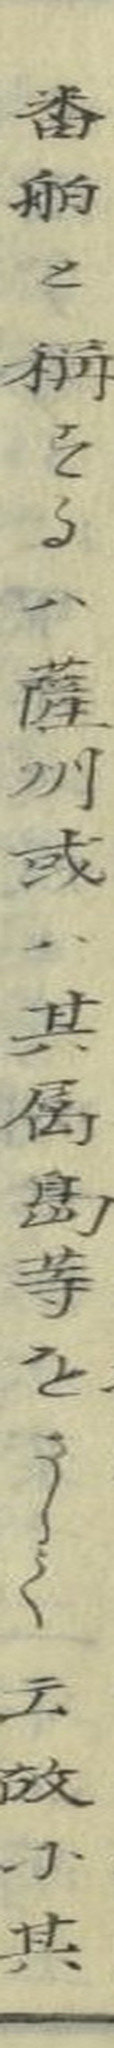番舶と称するは薩州或は其属島等をさして云故に其
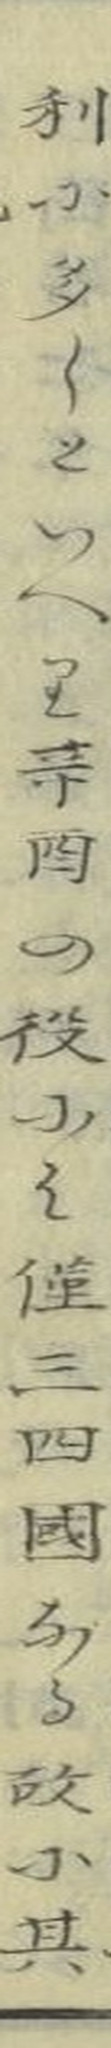利に多しといへり辛酉の役にて僅三四国なる故に其
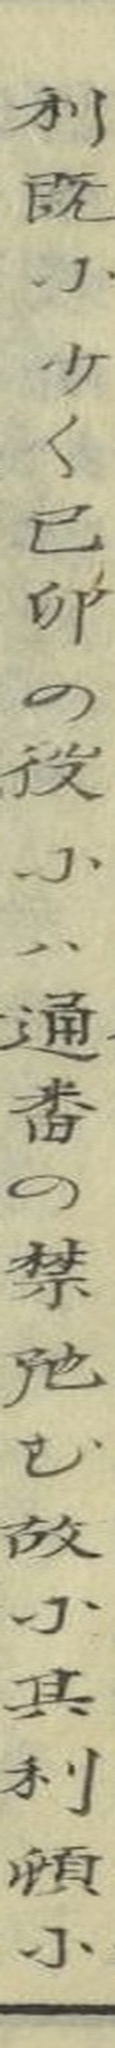利既に少く己卯の役には通番の禁弛む故に其利頓に
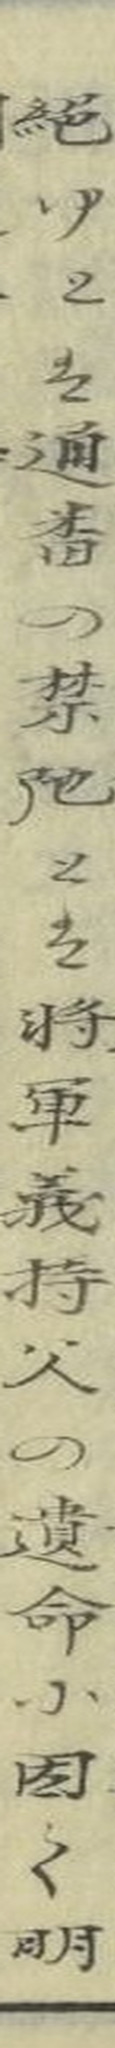絶ゆとは通番の禁弛とは将軍義持父の遺命に因て明
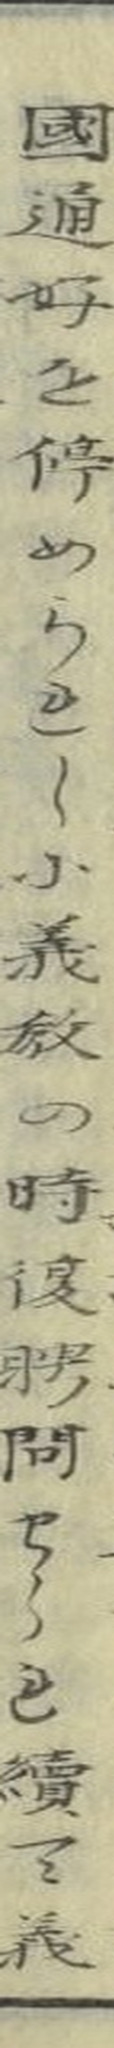国通好を停められしに義教の時復聘問せられ続て義
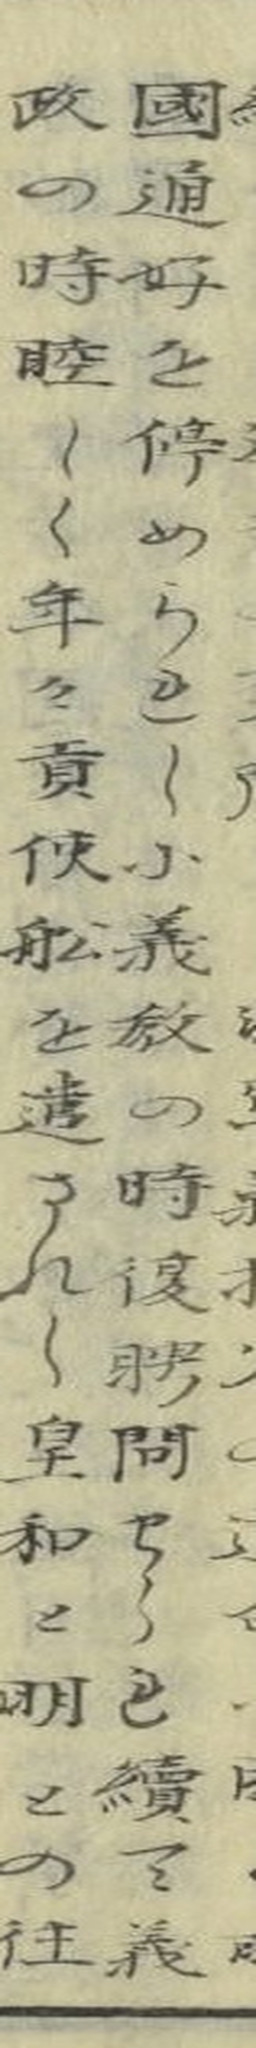政の時睦しく年々貢使舩を遣されし皇和と明との往
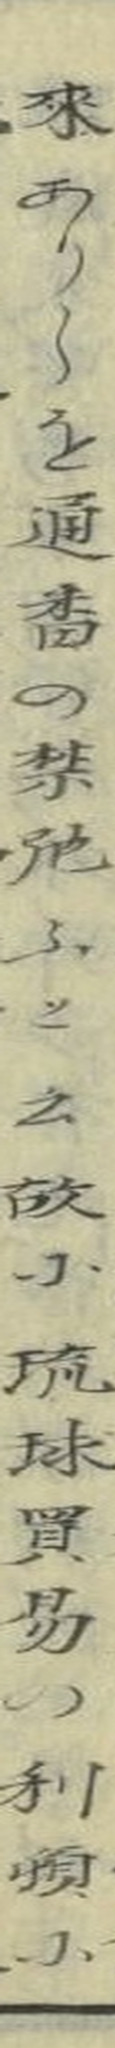来ありしを通番の禁弛ふと云故に琉球買易の利頓に
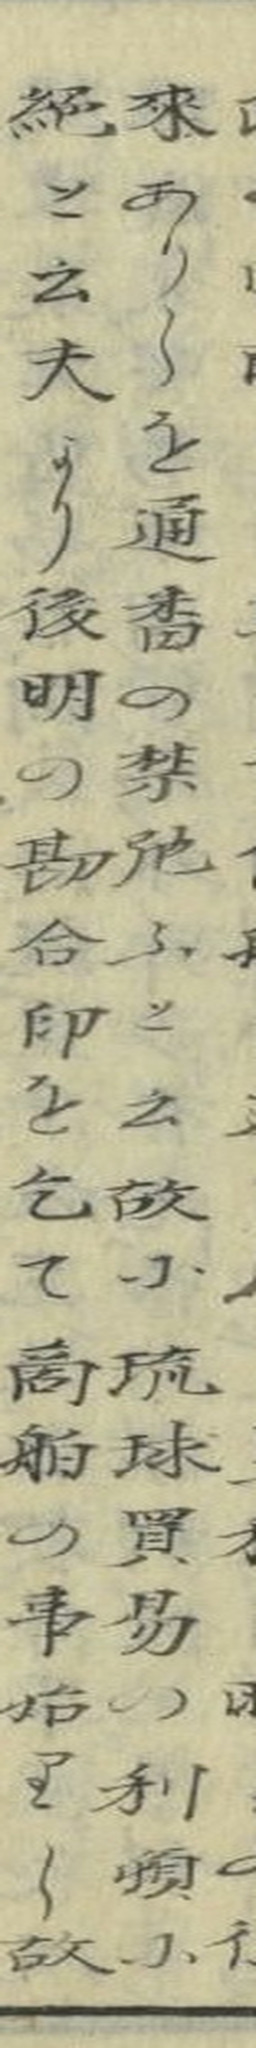絶と云夫より後明の勘合印を乞て商舶の事始りし故
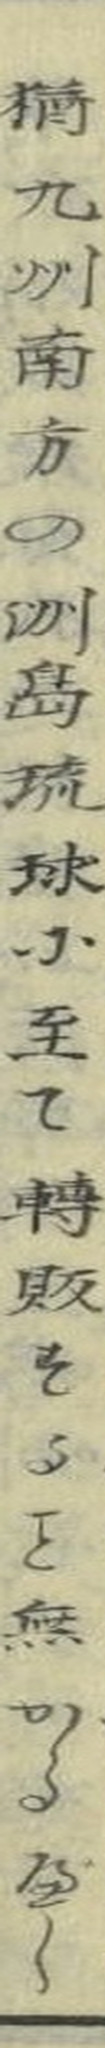猶九州南方の洲島琉球に至て転販すること無かるべし
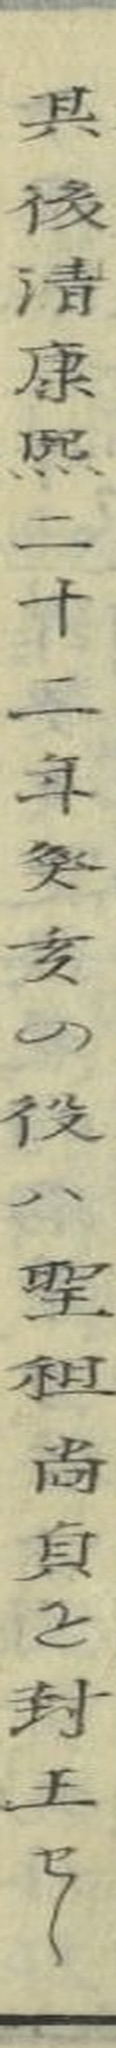其後清康煕二十二年癸亥の役は聖祖尚貞を封王せし
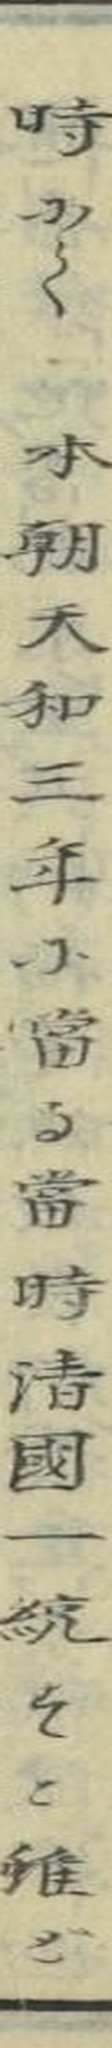時にて本朝天和三年に当る当時清国一統すと雖ど
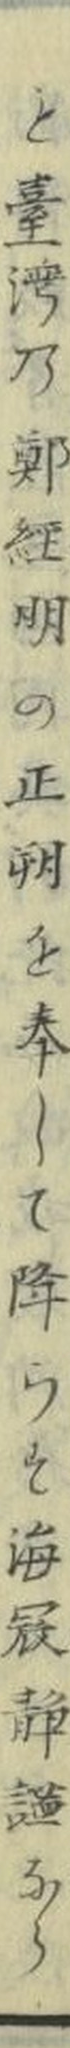も台湾の鄭経明の正朔を奉して降らす海冠静謐なら
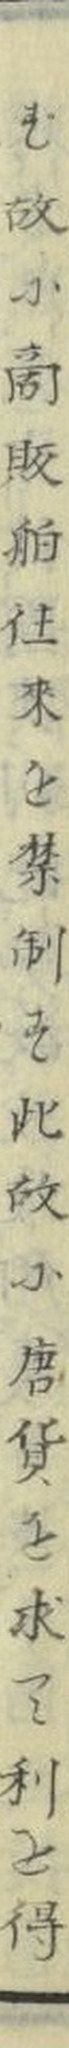む故に商販舶往来を禁制す此故に唐貨を求て利を得
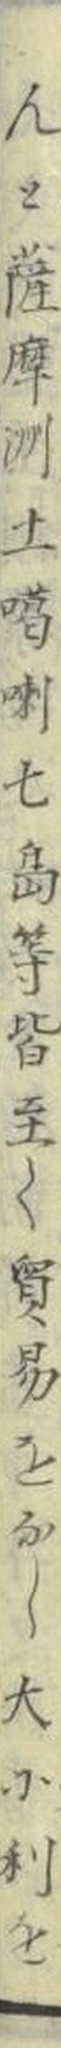んと薩摩洲土噶喇七島等皆至て貿易をなし大に利を
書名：琉球沿革志 下
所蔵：University of the Ryukyus Library
